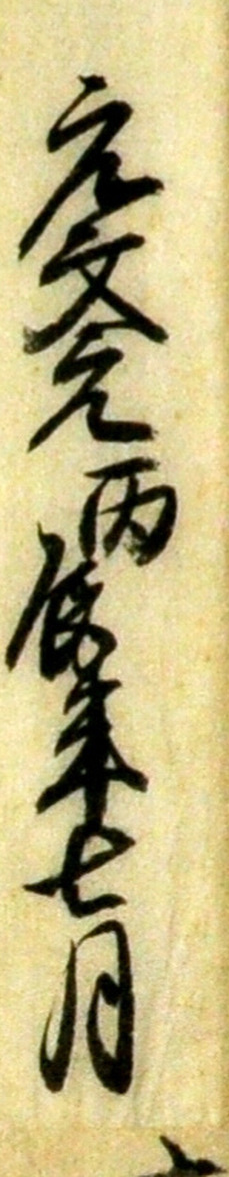元文元丙辰年七月
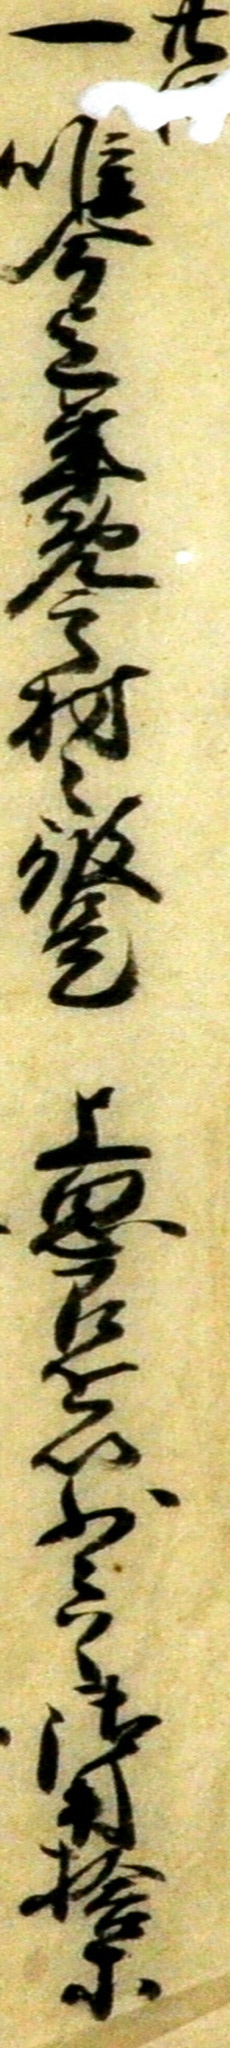一只今迄年免之村々彼是上思召を以少々ツヽ御用捨等
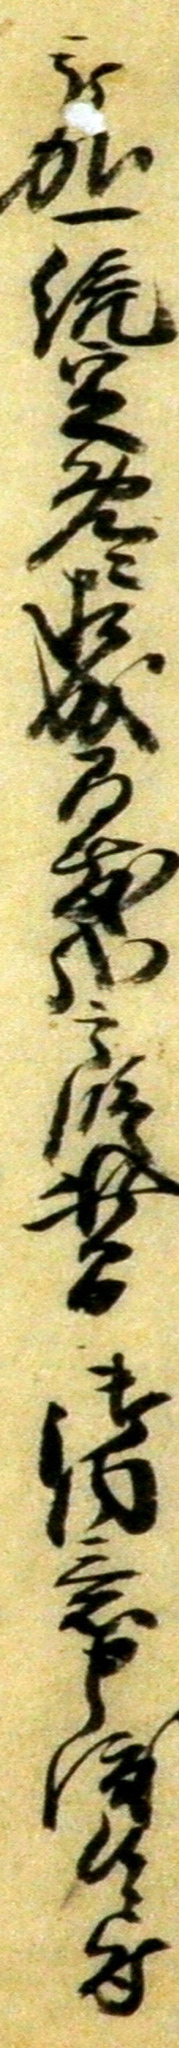被加一統定免ニ相成間敷哉之段此間御内意申渡候ニ付
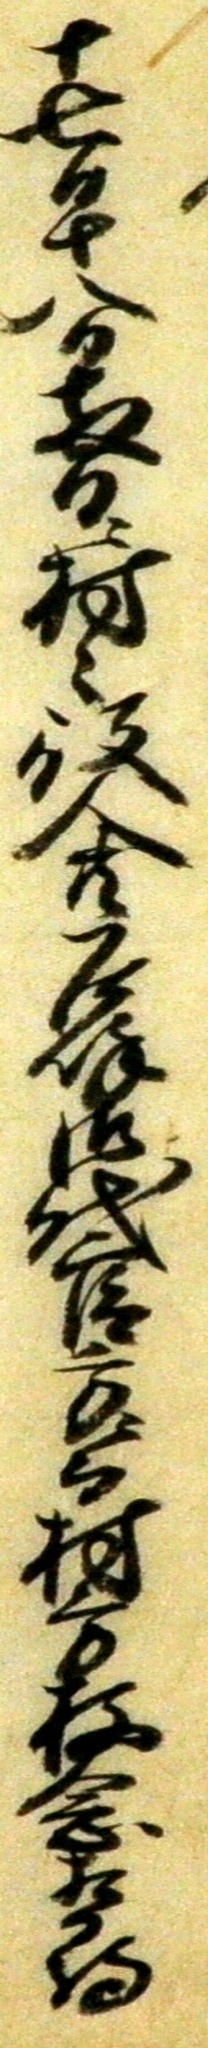十七日十八日両日ニ村々役人共召呼御代官方ニ而村方存念相尋
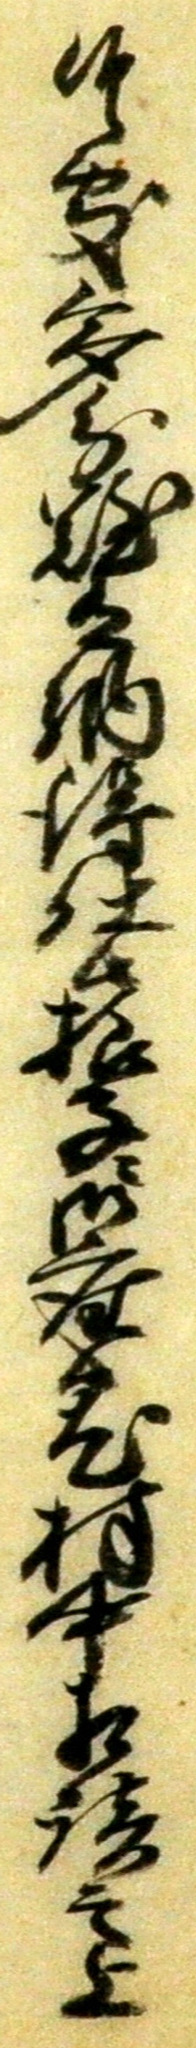候之處多分難有納得仕候様子ニ御座候尤村中相談之上
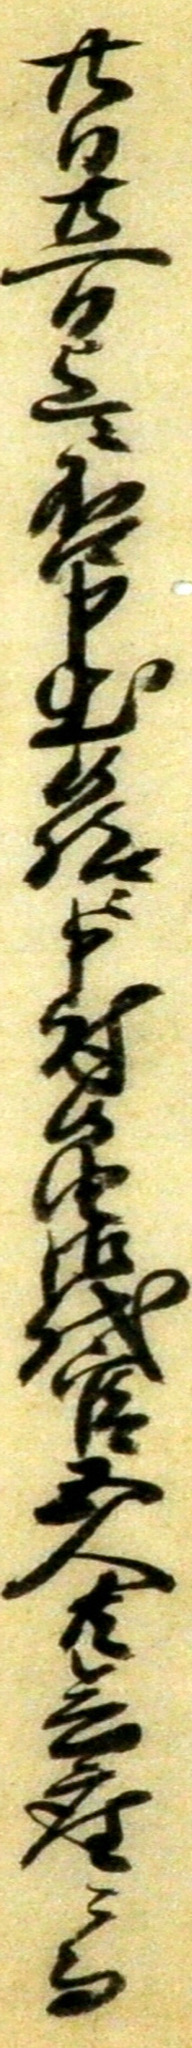廿日廿一日迄ニ否申出候様ニ申付候由御代官五人共会座ニ而
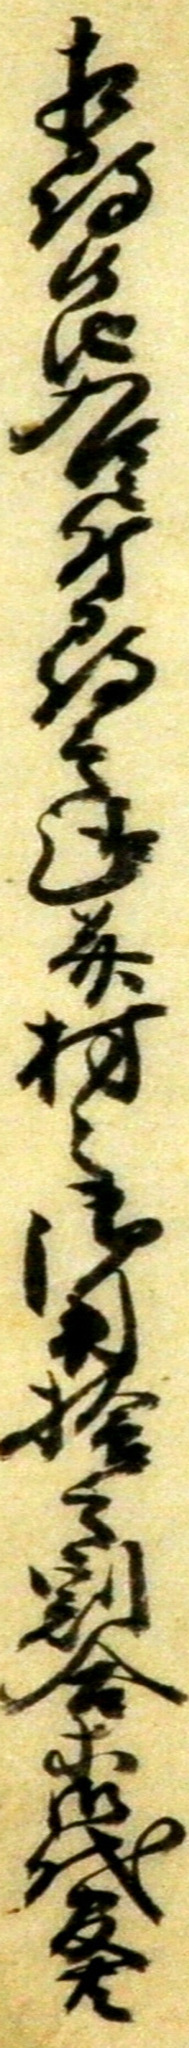相尋候由右ニ付尋其趣幷村々御用捨之割合等御代官共
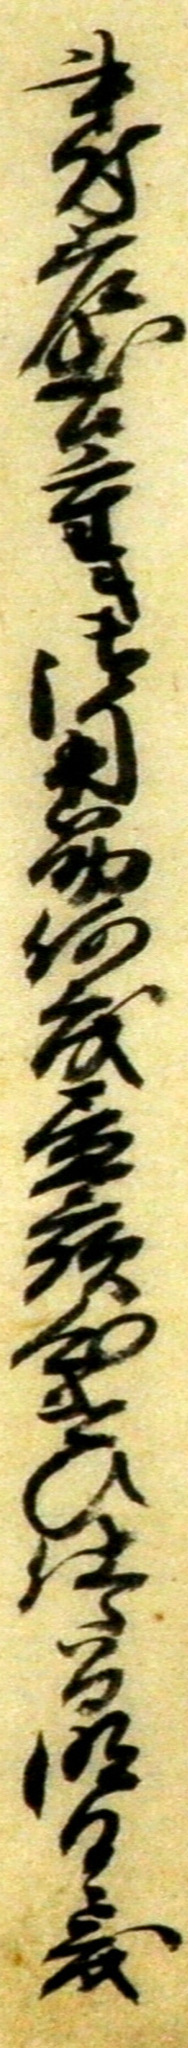書付差出重キ御用筋何茂昼夜心遣ひ仕候間明日ニ茂
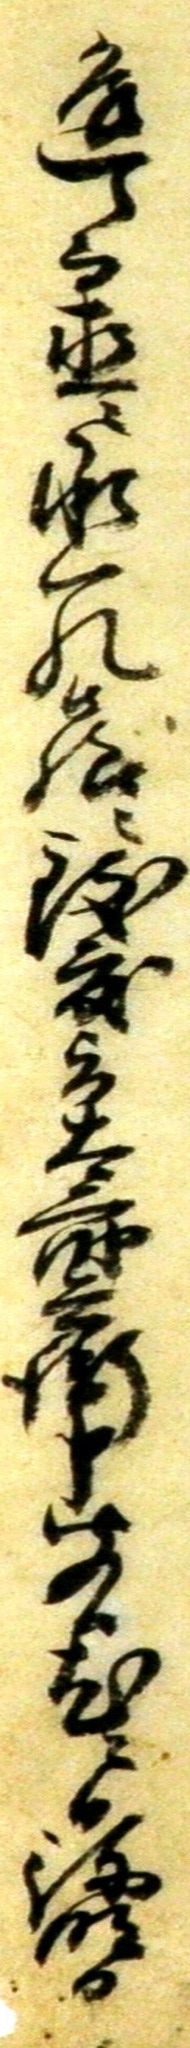逢候而直ニ承くれ候様ニ致度旨太郎兵衛申聞御尤ニ候弥明日

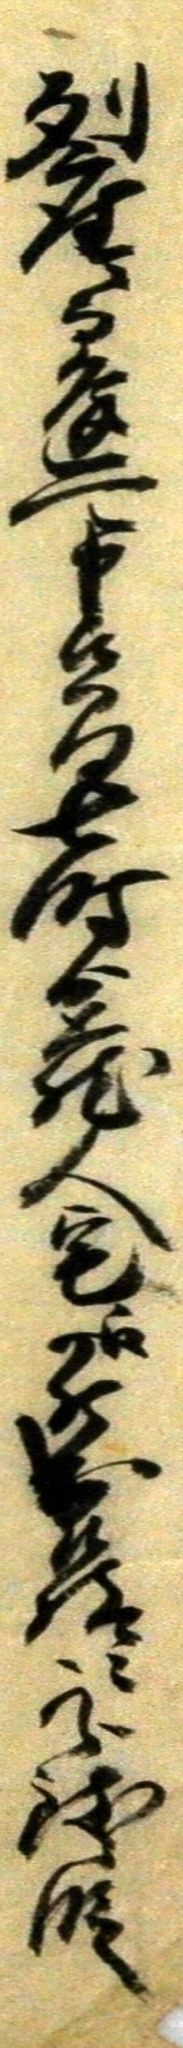列座ニ而逢可申候間七時ゟ蔵人宅江罷出候様ニ可被致候段
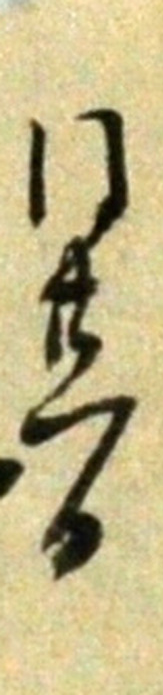同廿一日
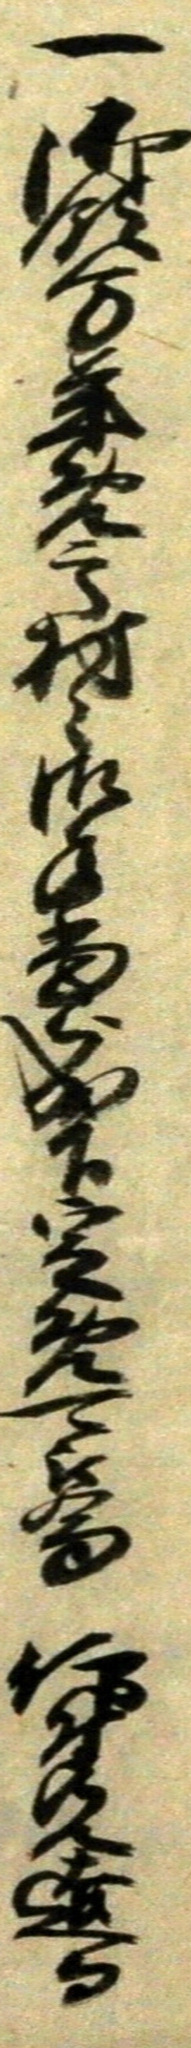一御領分年免之村々御手当被成下定免可被為仰付先達而
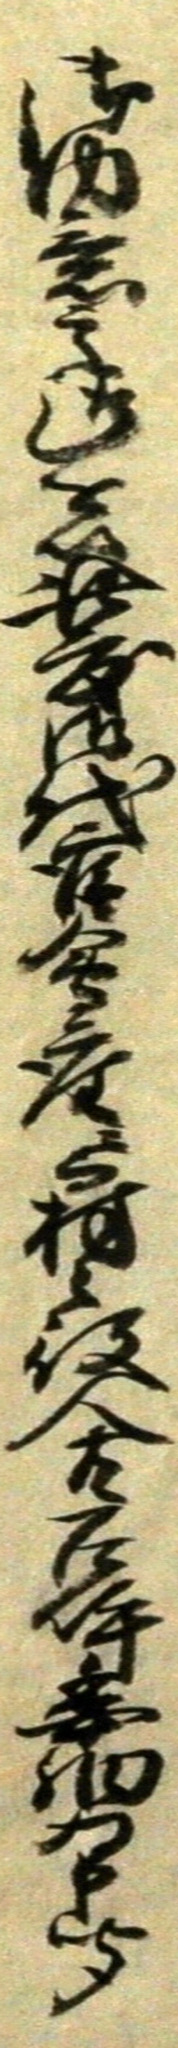御内意之趣を以此度御代官会座ニ而村々役人共召呼委細為申聞
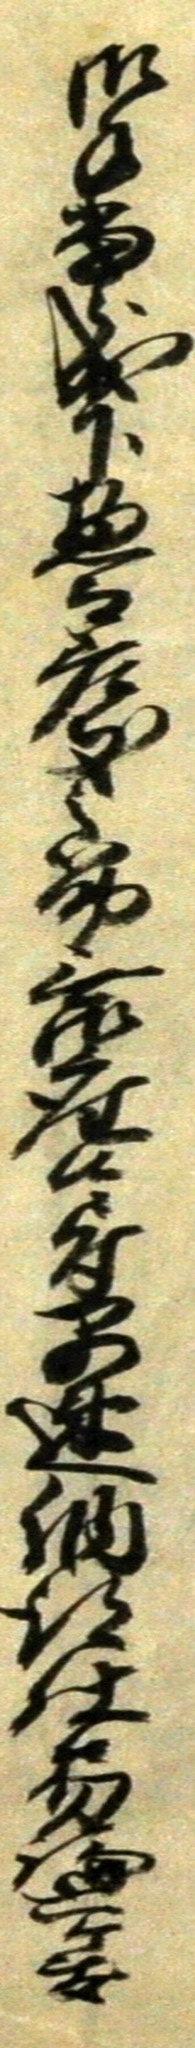御手当被成下惣而差支之筋無御座候ニ付早速納得仕候勿論六ヶ敷
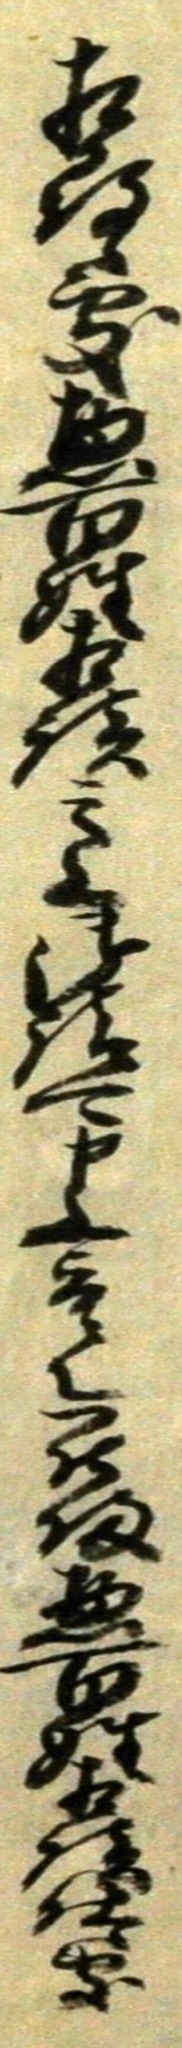相尋候処惣百姓相談之上御請可申上旨ニて罷帰惣百姓相談仕候処
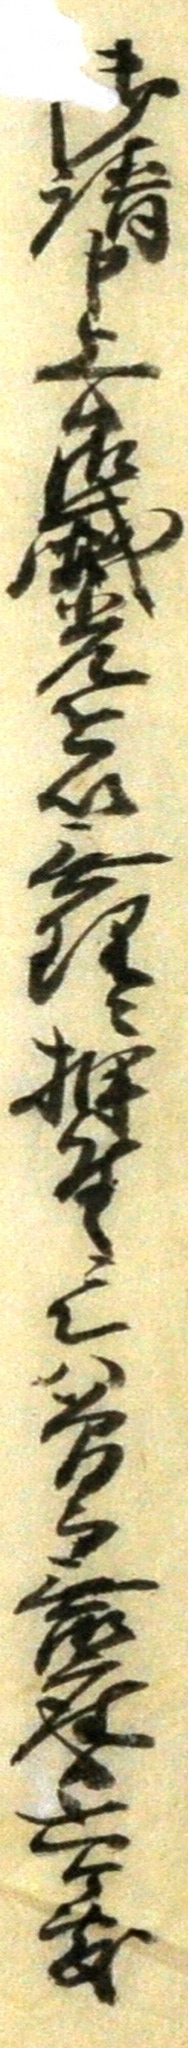御請申上候御威光を以無理ニ押付候ニてハ曽而無御座候六ヶ敷
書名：留書
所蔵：伊那市立高遠町図書館・合同会社AMANE
